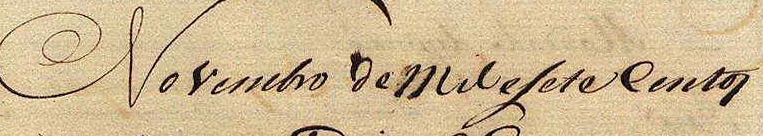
Novembro de mil e seteCentos
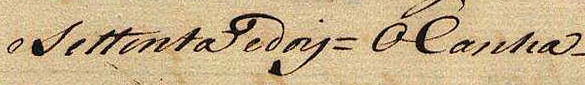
e settenta e dois= OCanha
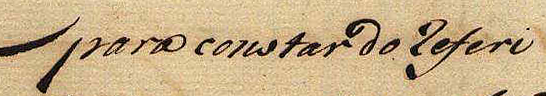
E para constar do Referi
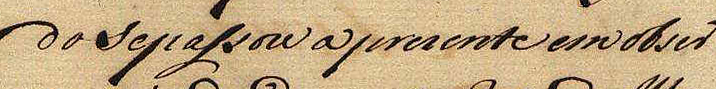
do se passou a presente em obser
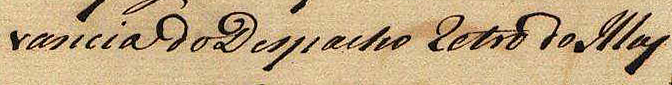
vancia do Despacho Retro do Illus
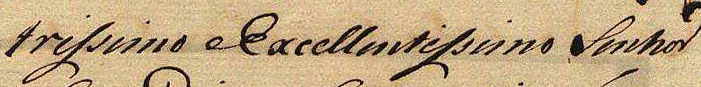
trissimo e Excellentissimo Senhor
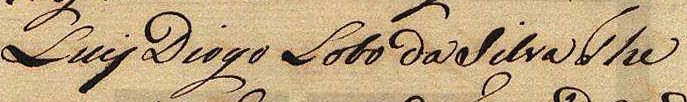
Luis Diogo Lobo da Silva The
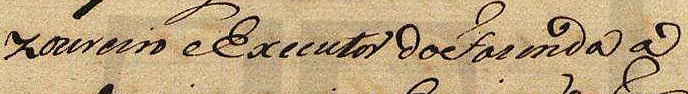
zoureiro e Executor da Fazenda a
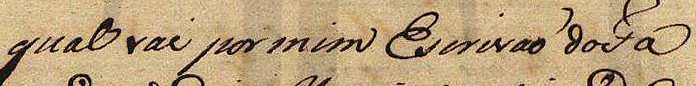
qual vai por mim Escrivaõ da Fa
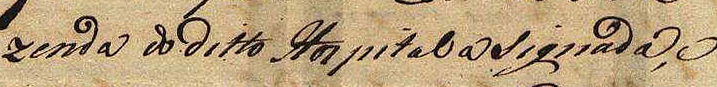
zenda do ditto Hospital asignada, e
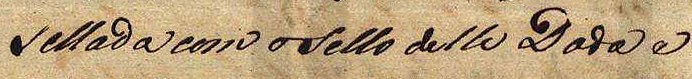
sellada com o sello delle Dada e
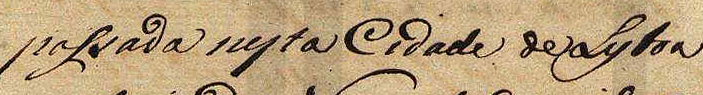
passada nesta Cidade de Lisboa
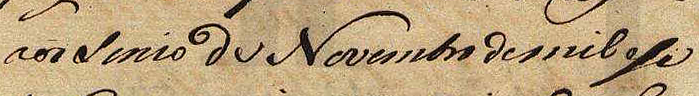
aos Sinco de Novembro de mil se
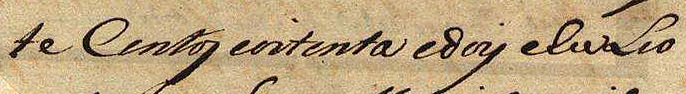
teCentos e oitenta e dois e Eu Leo
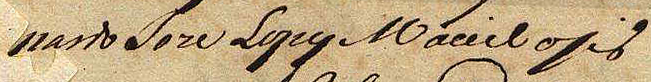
nardo Ioze Lopes Maceil o fis
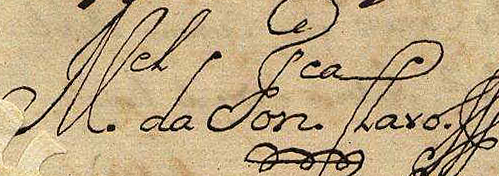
M.el da Fon.ca Claro.
